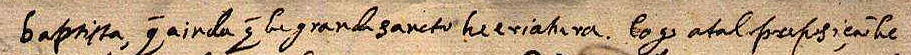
baptista, q̄ ainda q̄ he grande sancto he criatura. logo a tal proposiçaõ he
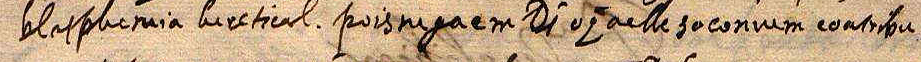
blasphemia heretical. pois nega em Ds̄ o q̄ a elle so conuem e o atribu
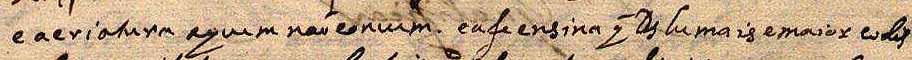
e a criatura a quem naõ conuem. e a fe ensina q̄ Ds he mais e maior e o dis
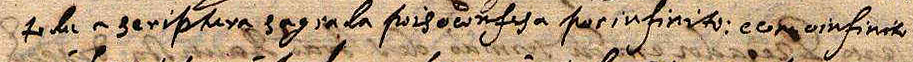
toda a scriptura sagrada pois o confesa por infinito: e com o infinito
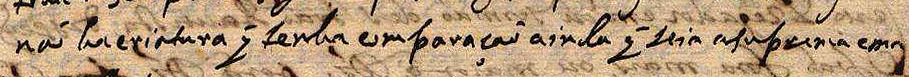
naõ ha criatura q̄ tenha comparaçaõ ainda q̄ seia a suprema e ma
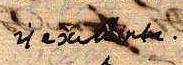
is excelente.
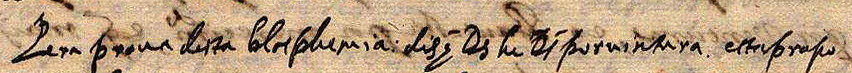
Pera proua desta blasphemia dis q̄ Ds he Ds̄ por uintura. esta propo
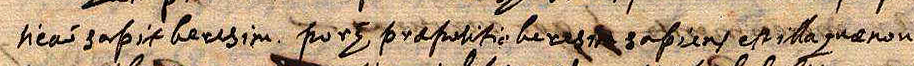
siçaõ sapit heresim. porq̄ præpositio heresim sapiens est illa quæ non
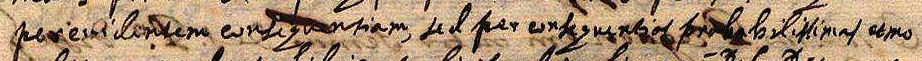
per euidentem consequentiam, sed per consequentias probabilissimas et mo
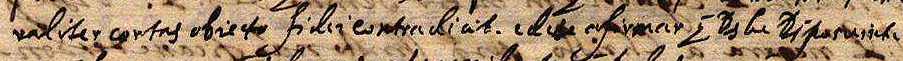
raliter certas obiecto fidei contradicit. e dise afirmar q̄ Ds he Ds̄ por uintu
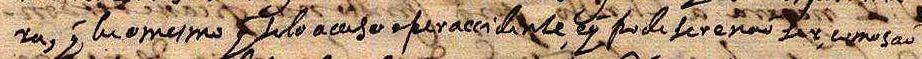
ra, q̄ he o mesmo q̄ selo acaso e per accidente, e q̄ pode ser e naõ ser, como saõ
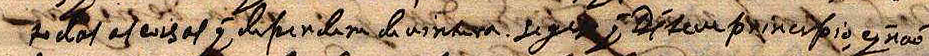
todas as coisas q̄ dependem de uintura. segese q̄ Ds̄ tem principio, e q̄ naõ
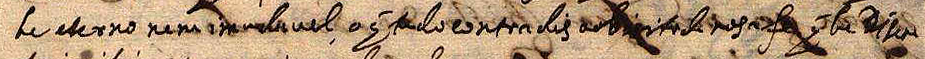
he eterno nem imudauel, o q̄ tudo contradis ao b ito de nosa fe q̄ he Ds̄ ser
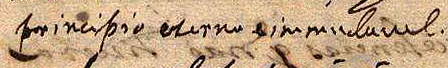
principio eterno e immudauel.
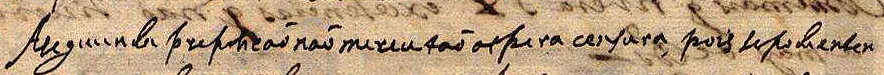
A seguunda preposiçaõ naõ merece taõ aspera censura, pois se pode enten
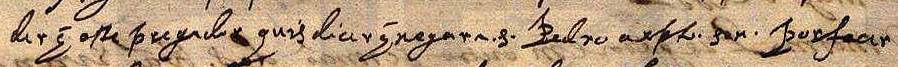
der q̄ este pregador quis dicer q̄ negara .s. Pedro a xpto. s. n. por facer
